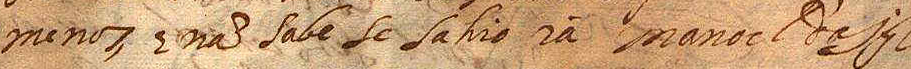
menos, E não sabe se sahio ia manoel da syl
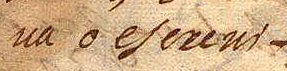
ua o escreui
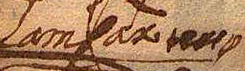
Lamsarote _
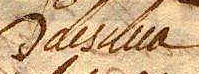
Po de silua
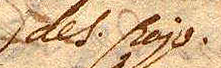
de s. pajo.
